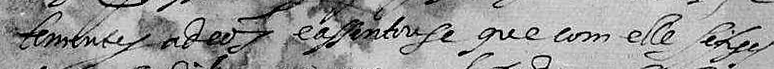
tementes a deos e assentouse que com elle se fises
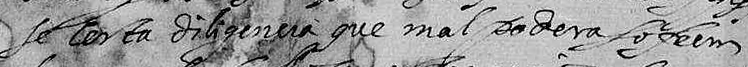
se certa diligencia que mal podera sofrem
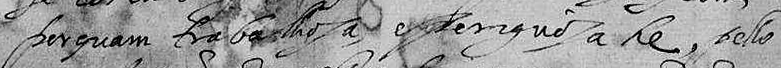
por quam trabalhosa e periguoza he, pello
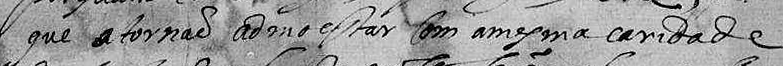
que a tornaõ admoestar com a mesma caridade
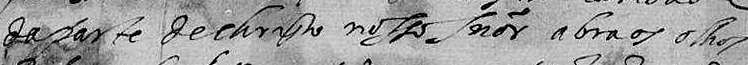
da parte de christo nosso Snor̄ abra os olhos
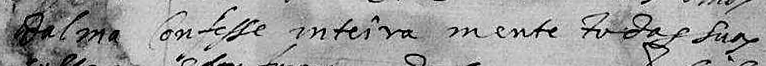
dalma Confesse inteiramente todas suas
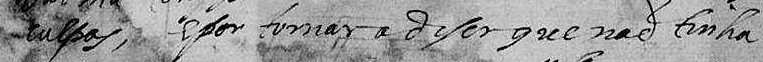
culpas, E por tornar a diser que naõ tinha
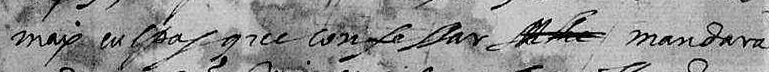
mais culpas que confessar _lhe mandara
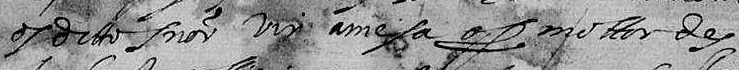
os ditto snor̄ vir a mesa o ꝓmottor des
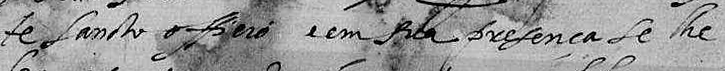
te sancto officio e em sua presença se lhe
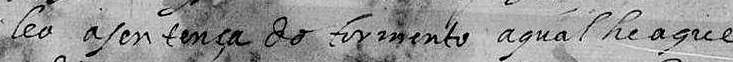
leo a sentença do tormento a qual he a que
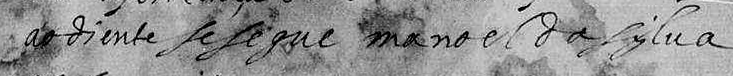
ao diante se segue manoel da sylua
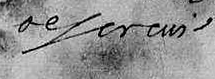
o escreui.
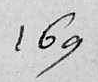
169
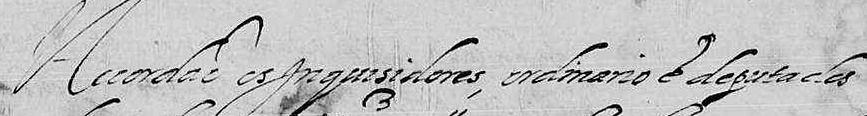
Accordaõ os Jnquisidores, ordinario e deputados
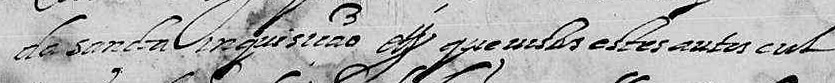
da sancta inquisição ettꝭ que uistos estes autos cul
